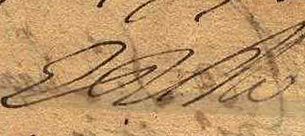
E. R. Me
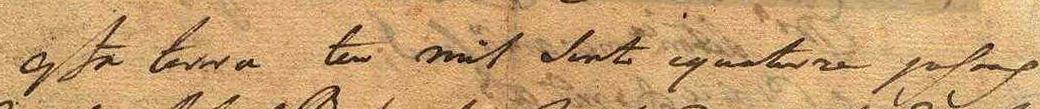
esta terra tem mil sento e quatorze pesoas
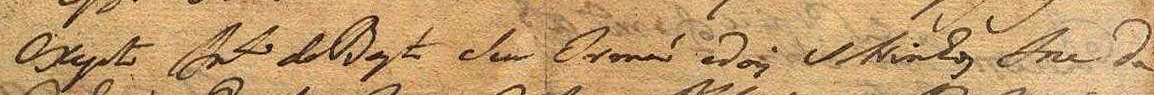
exepto An.to de Basto Seu Ermaõ e dois Sobrinhos Ioze da
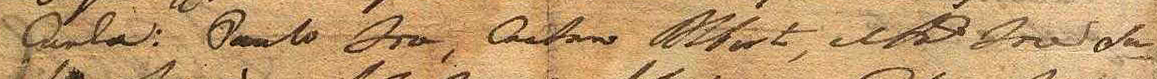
Cunha: Paulo Ioze, Caetano Alberto, e Anto Ioze Sa
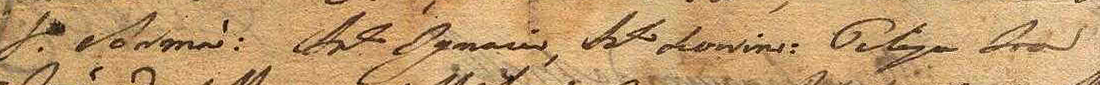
t.o Sormaõ: An.to Egnacio, Anto severino: Felipe Ioaõ
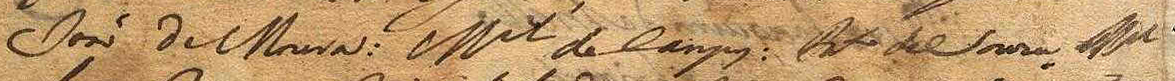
Ioaõ de Moura: Mel de Campos: Anto de Souza Mel
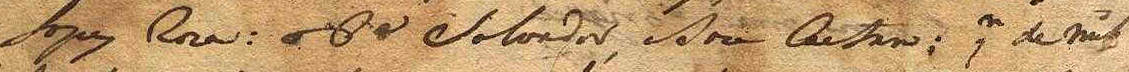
Lopes Roza: o Pe Salvador, e Ioze Caetano; qn de mil
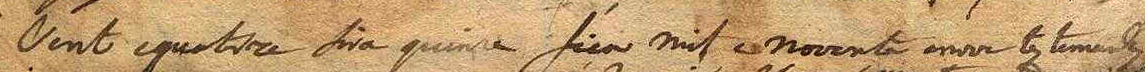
sento e quatorze tira quinze fica mil e noventa e nove testemunhas
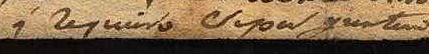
q̄ Requeiro se perguntem
